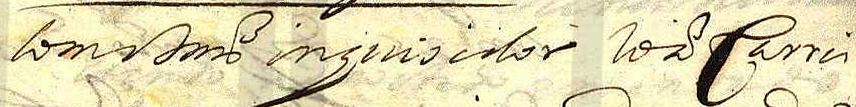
com o snr̄ inquisidor Ioaõ Carrei
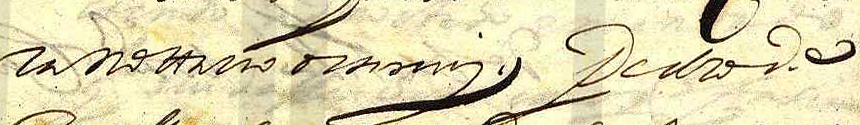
ra nottario o escreuj. Pedro de
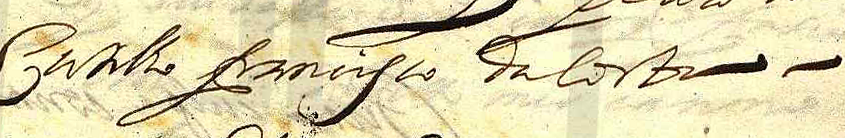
Catilho francisco da Costa
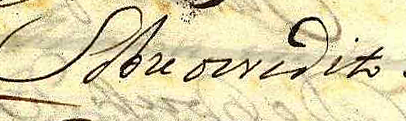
Sobre o credito.
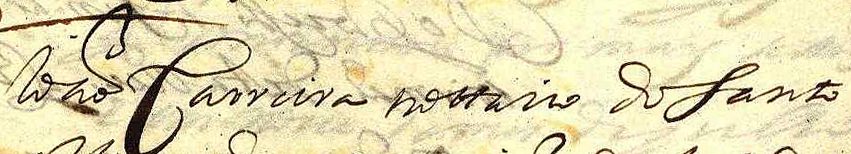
Ioão Carreira nottario do santo
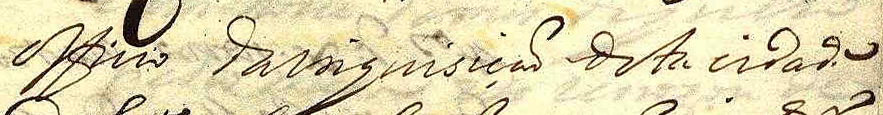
officio da inquisição desta cidade
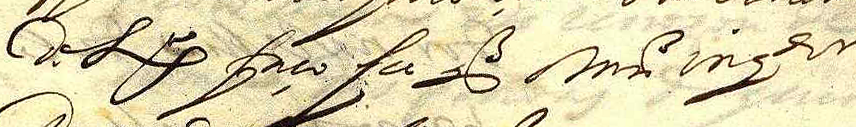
de Lxa faço fee q̄ o snro inqdor
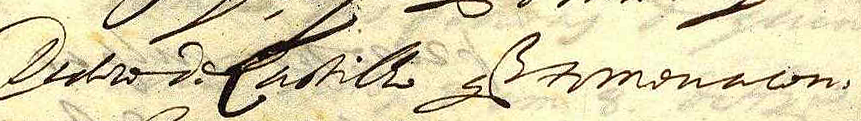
Pedro do Castilho q̄ tomou a con
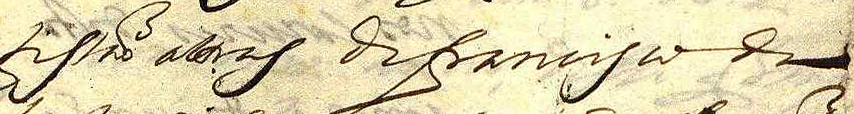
fissão attras de francisco da
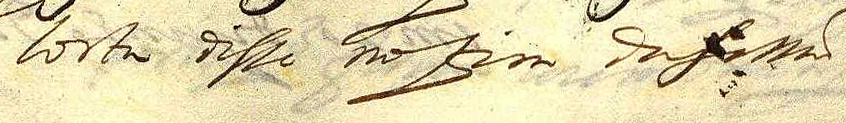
costa disse no fim da sessaõ
